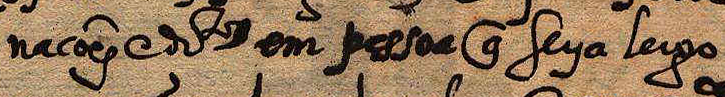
nações e drtos em pessoa q̄ seya leigo
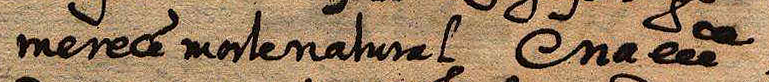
merecē morte natural e na eccca
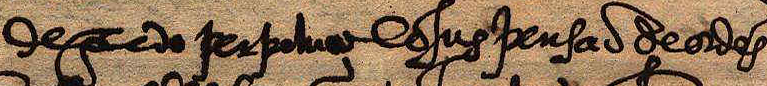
degredo perpetuo cō suspensaõ de ordēs
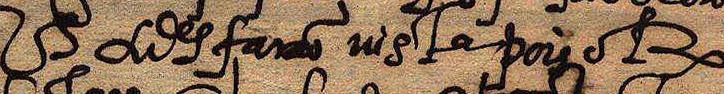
VS Sdes faraõ iusta pois o Rꝭ
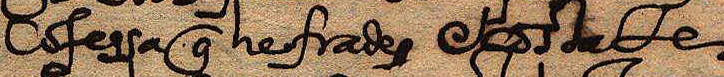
cōfessa q̄ he frades e cōsta ter
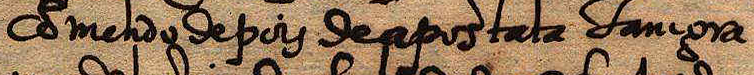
cōmetido depois de apostata tam gra
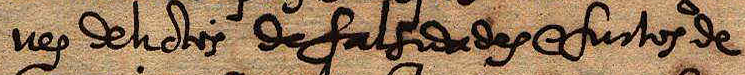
ues delictos de falsidades e furtos de
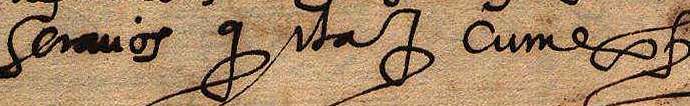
scrauos ꝗ ita J cum exp
